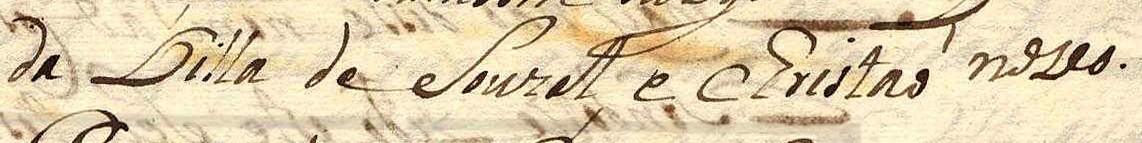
da Villa de Souzel, e christaõ novo
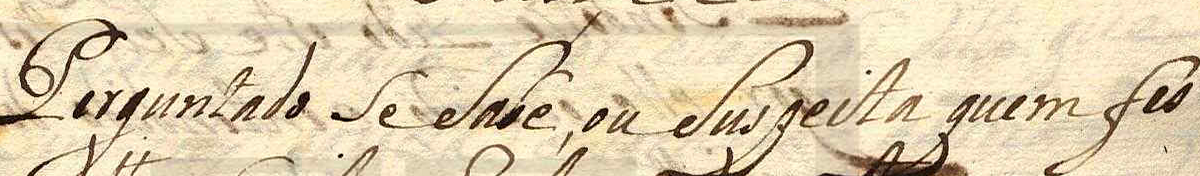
Perguntado se Sabe, ou Suspeita quem fes
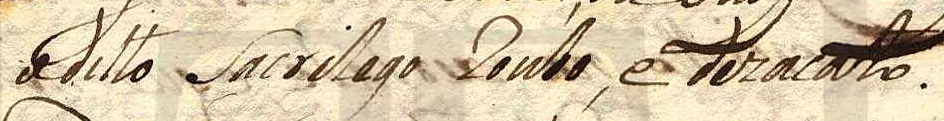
o ditto Sacrilego Roubo, e dezacato.
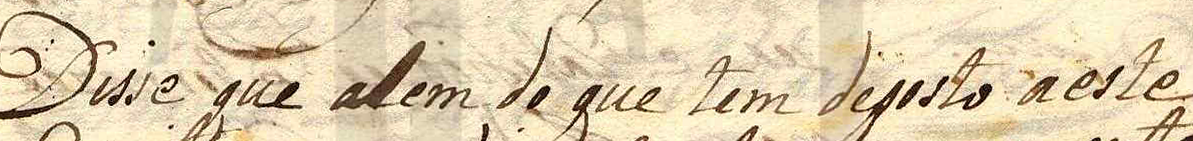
Disse que alem do que tem deposto a este
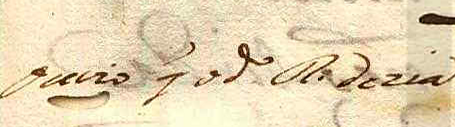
ouvio q̄ o d.o R. dezia
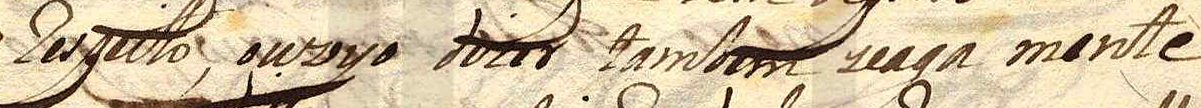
Respeito, ouvyo dizer tambem vagamente
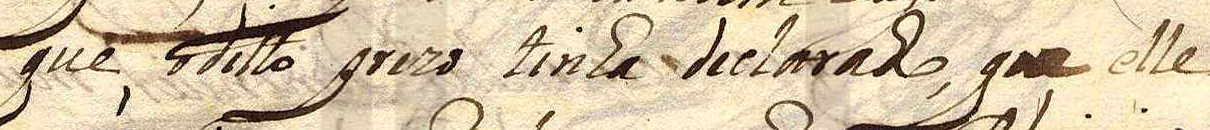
que, o ditto prezo tinha declarado, que elle
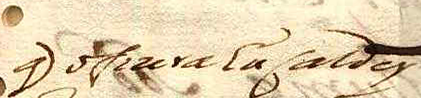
q̄ o fizera hū Caldey
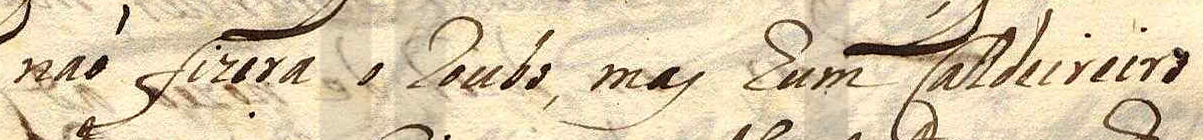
naõ fizera o Roubo, mas hum Caldeireiro
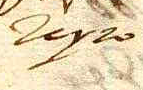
Reyro
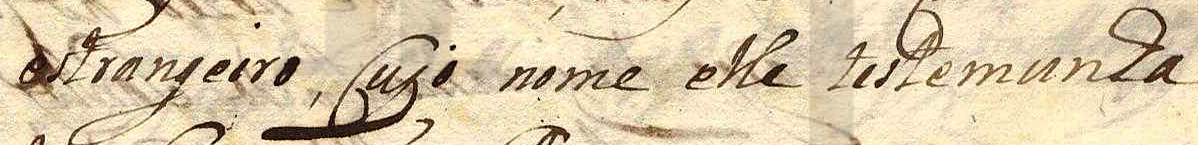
estrangeiro, Cujo nome elle testemunha
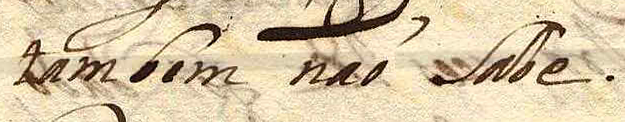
tambem naõ sabe.
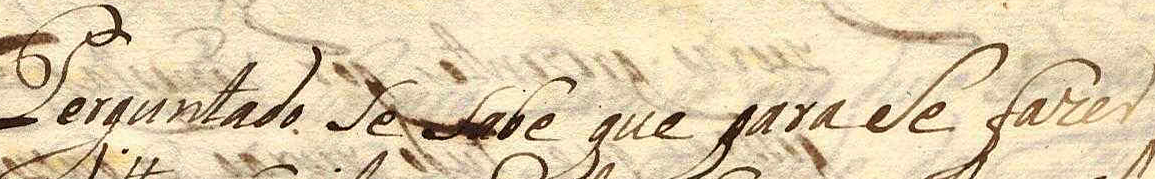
Perguntado se sabe que para se fazer
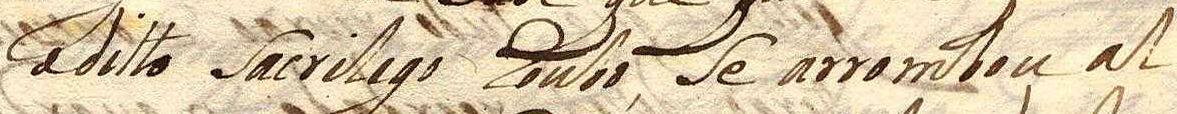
o ditto Sacrilego Roubo, se arrombou al
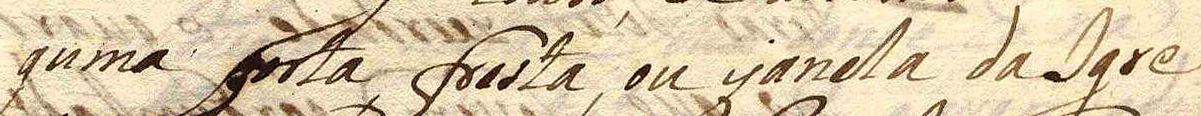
guma porta, fresta, ou janela da Igre
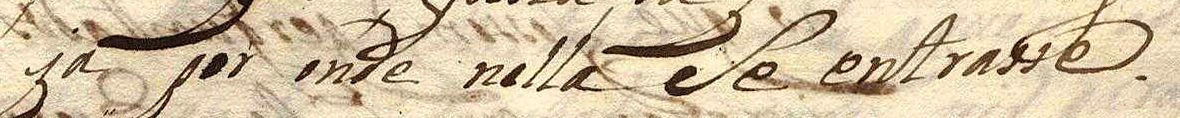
ja por onde nella Se entrasse.
